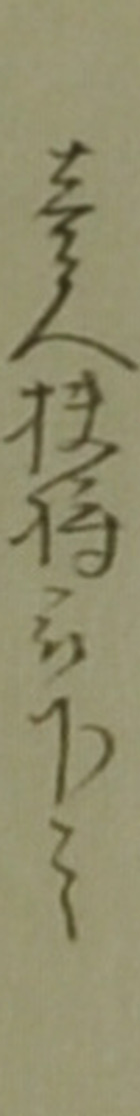壱人扶持被下之
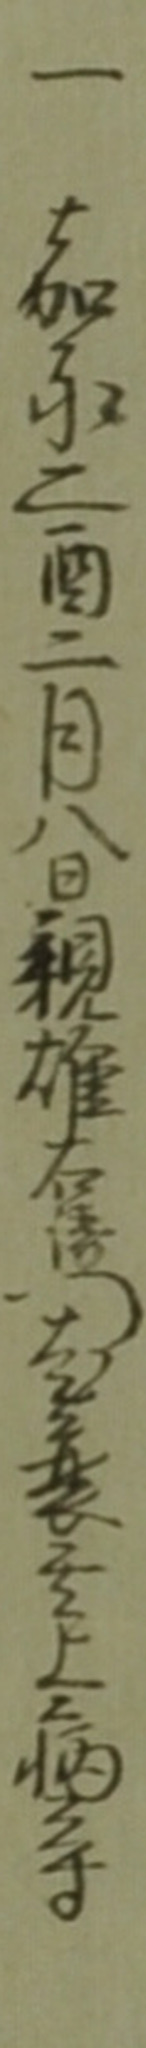一嘉永二酉二月八日親雄右衛門老衰其上病気
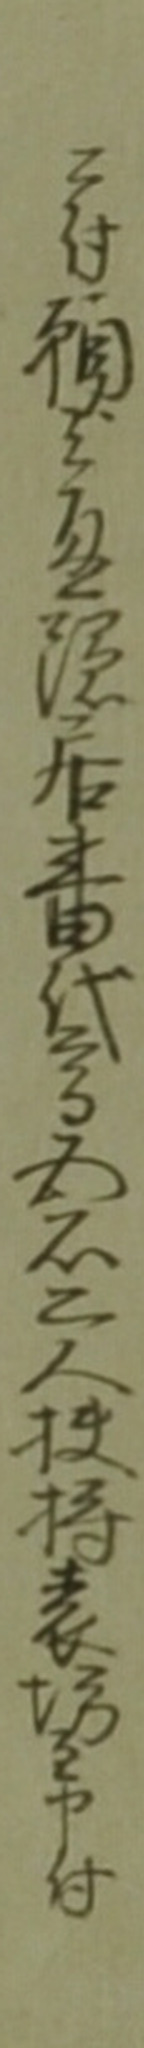ニ付願之通隠居番代高五石二人扶持表坊主申付
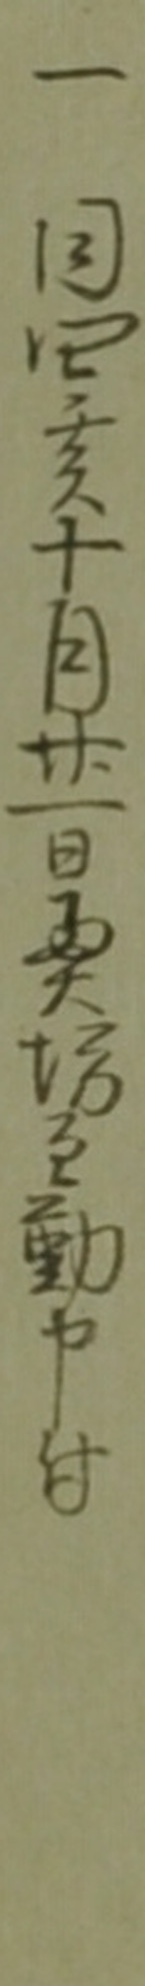一同四亥十月廿一日奥坊主勤申付
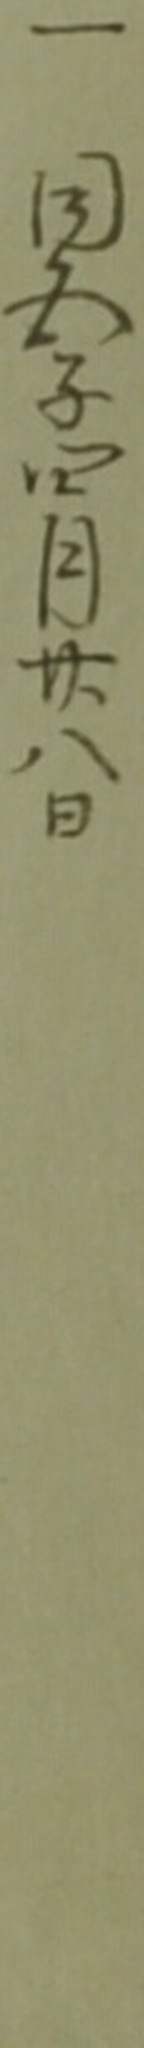一同五子四月廿八日
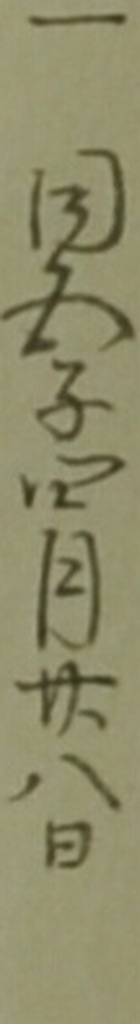一同五子四月廿八日
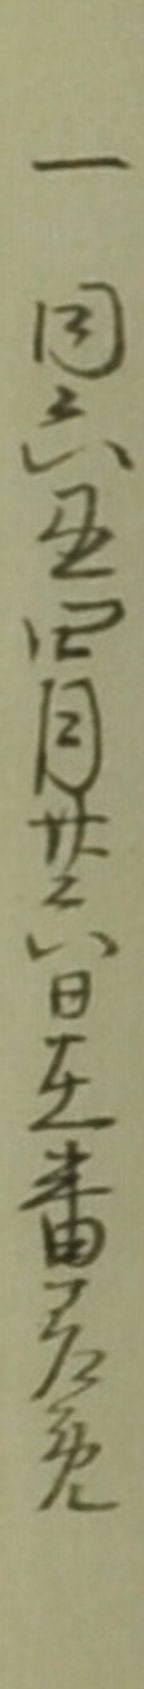一同六丑四月廿六日在番差免
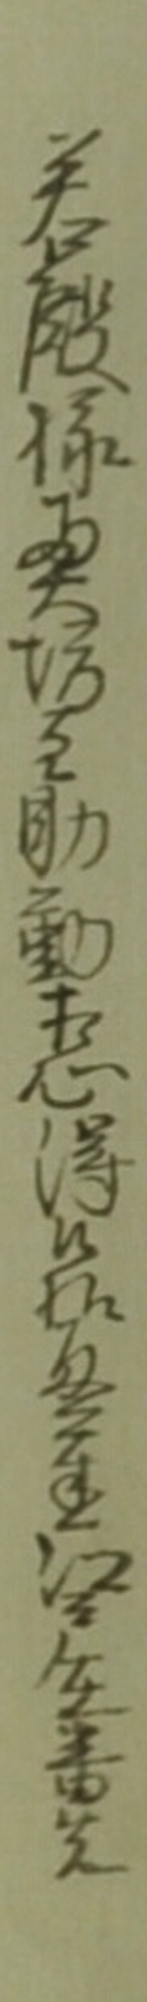若殿様奥坊主助勤相心得候様通達江戸在番先

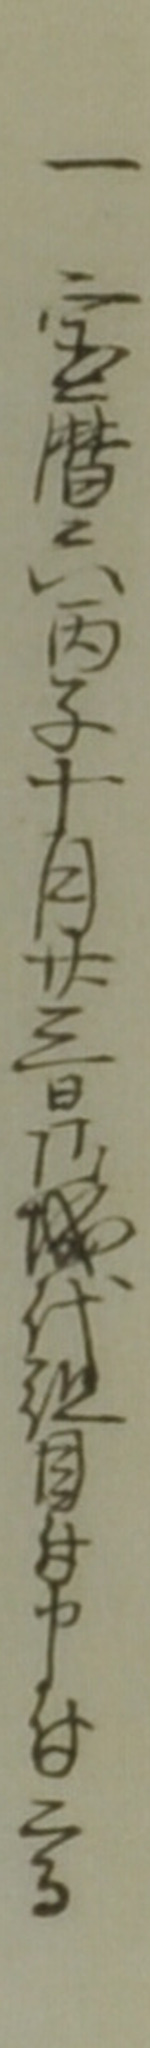一宝暦六丙子十月廿三日御城代組目付申付高
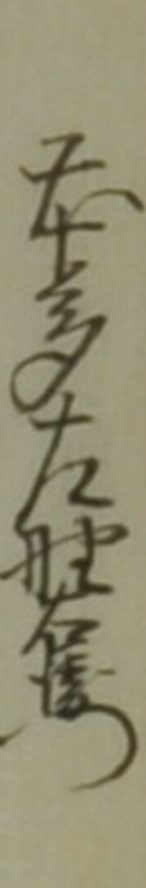本多左野右衛門
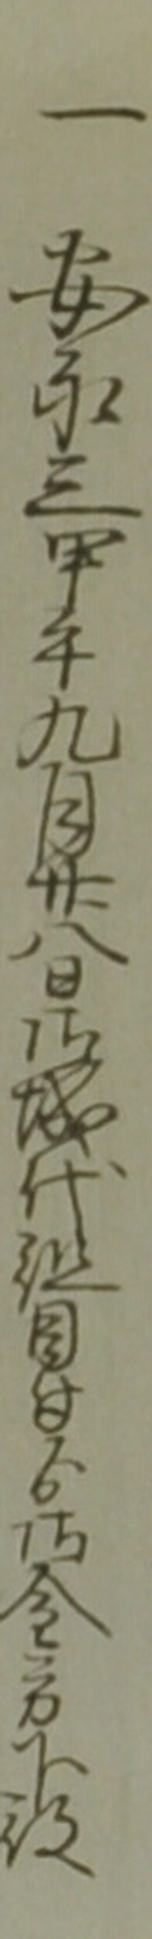一安永三甲午九月廿八日御城代組目付ゟ御金方下役
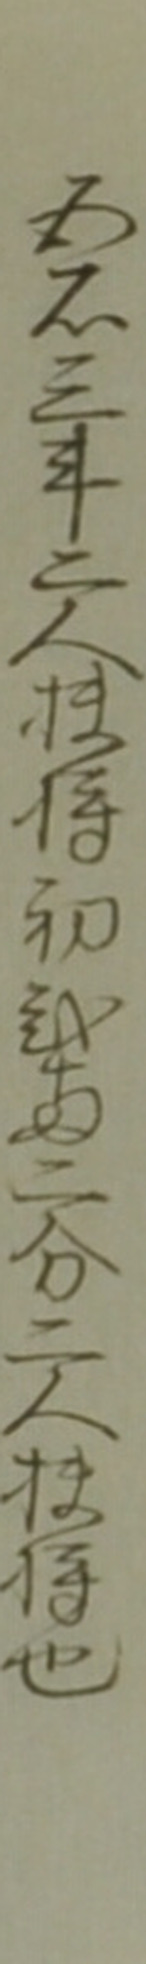五石三斗二人扶持初弐両二分二人扶持也
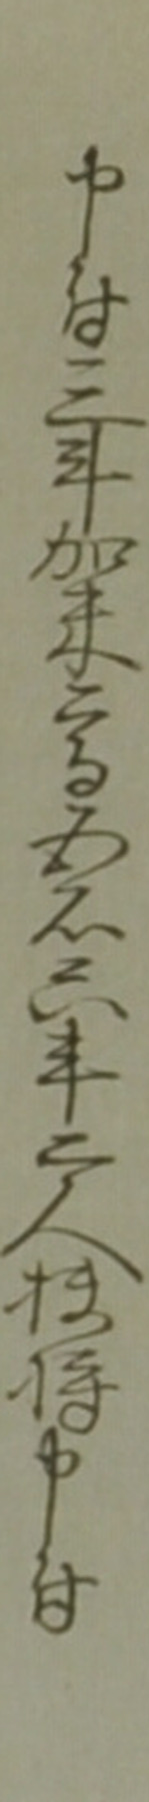申付三斗加米高五石六斗二人扶持申付
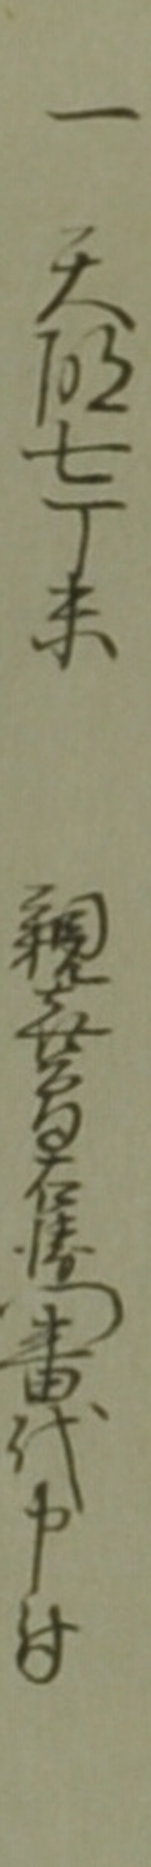一天明七丁未親喜曽右衛門番代申付
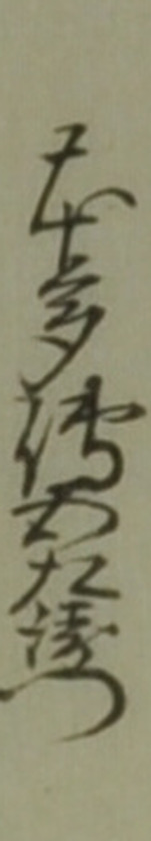本多伝五左衛門
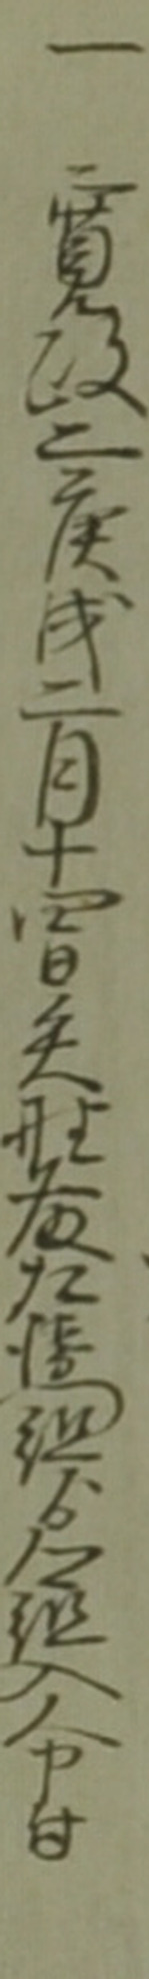一寛政二庚戌二月十四日矢野藤左衛門組ゟ郷組入人申付
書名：無足諸士勤仕録（九）
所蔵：伊那市立高遠町図書館・合同会社AMANE
